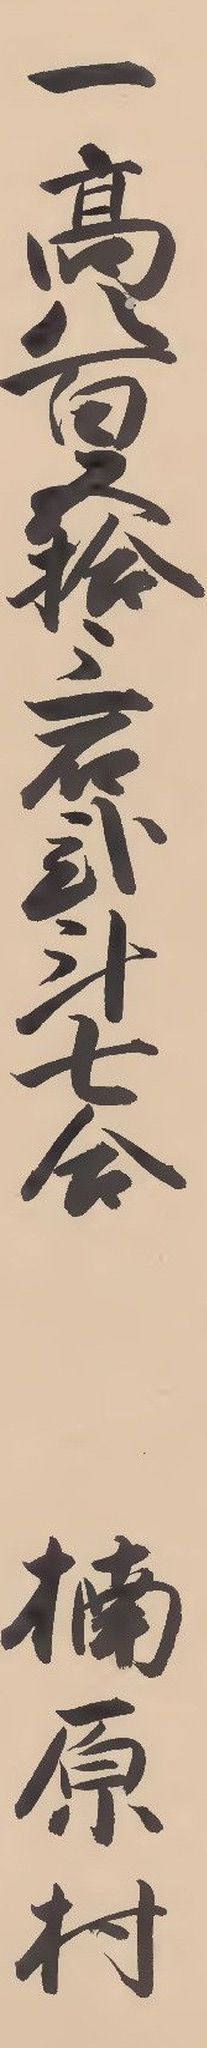一高八百五拾三石弐斗七合楠原村
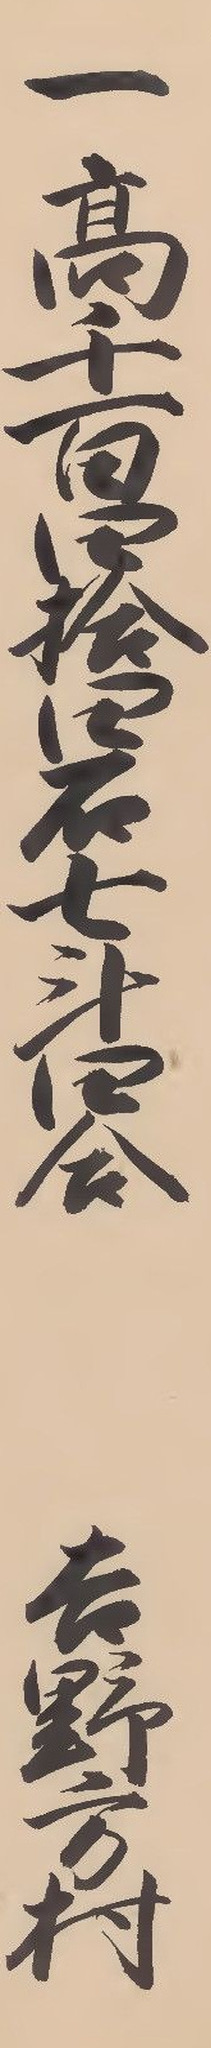一高千百四拾四石七斗四合吉野方村
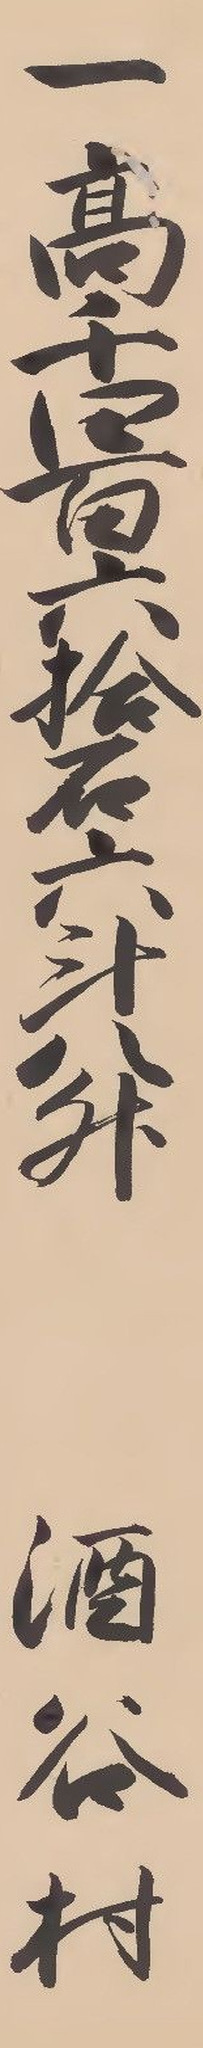一高千四百六拾石六斗八升酒谷村
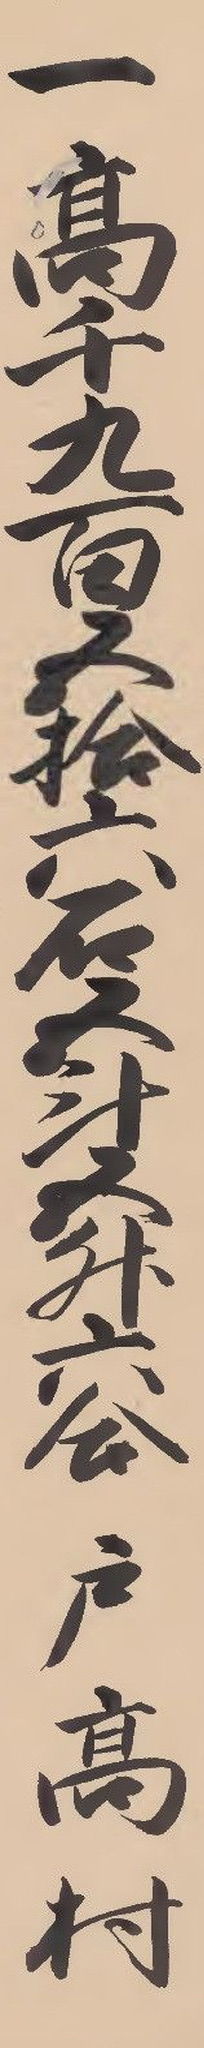一高千九百五拾六石五斗五升六合戸高村
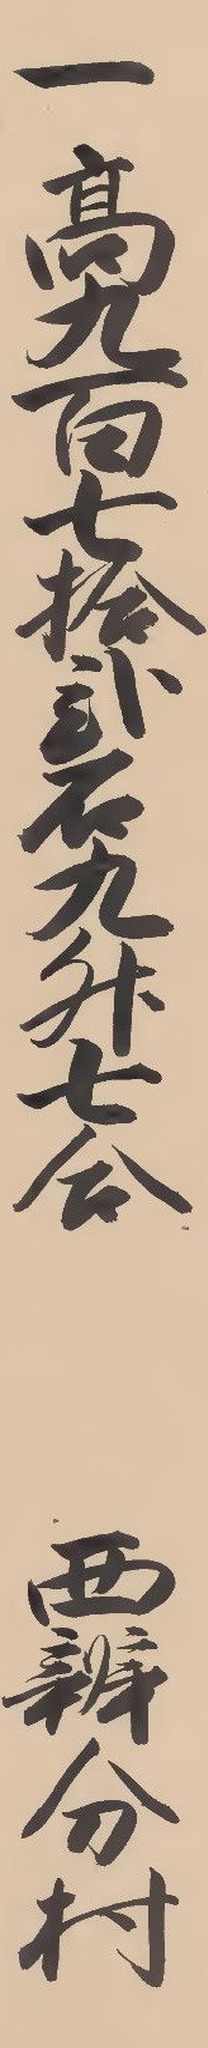一高九百七拾弐石九升七合西弁分村
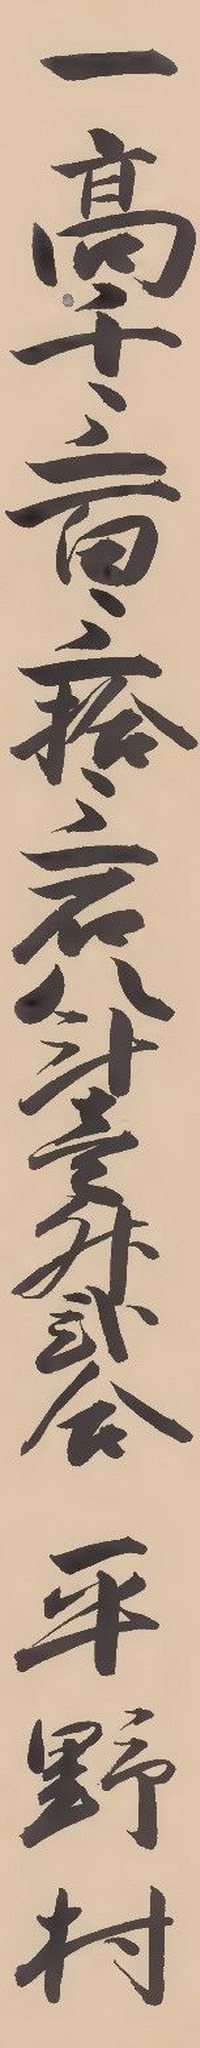一高千三百三拾三石八斗壱升弐合平野村
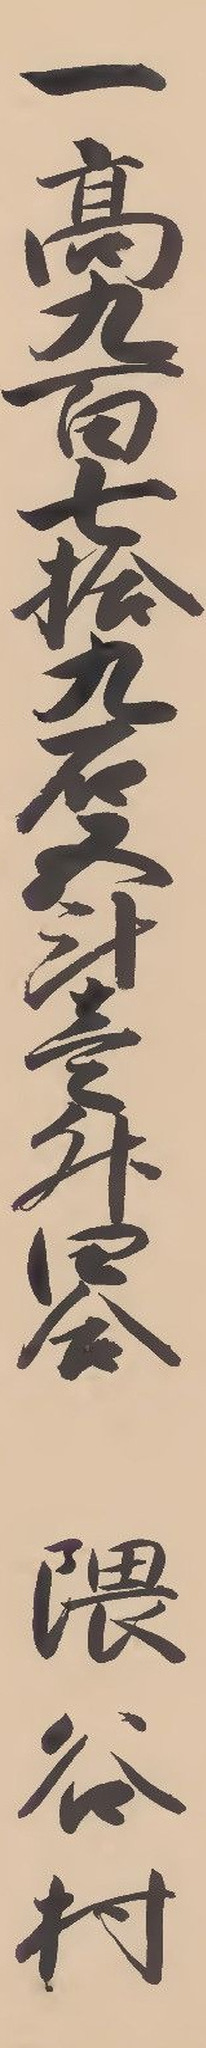一高九百七拾九石五斗壱升四合隈谷村

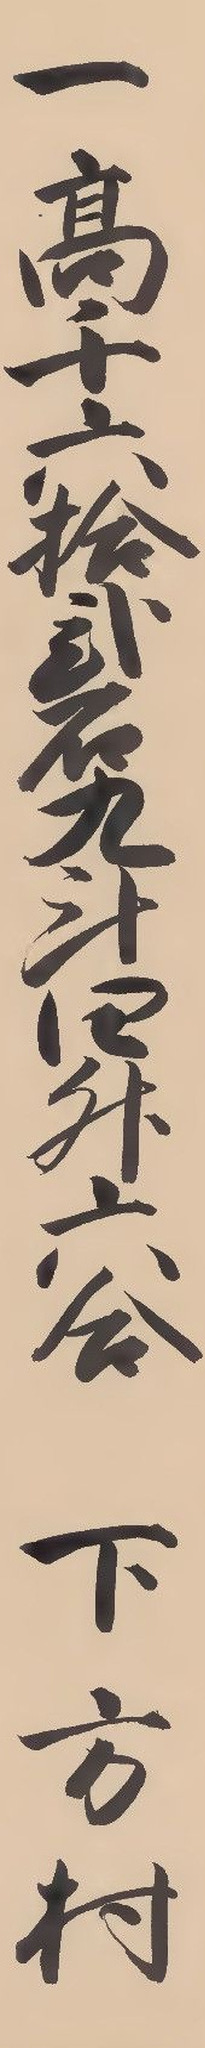一高千六拾弐石九斗四升六合下方村
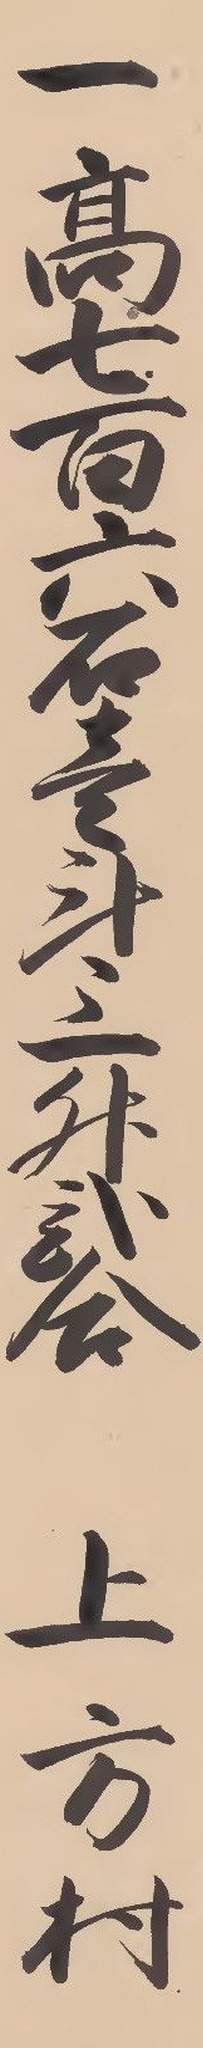一高七百六石壱斗三升弐合上方村
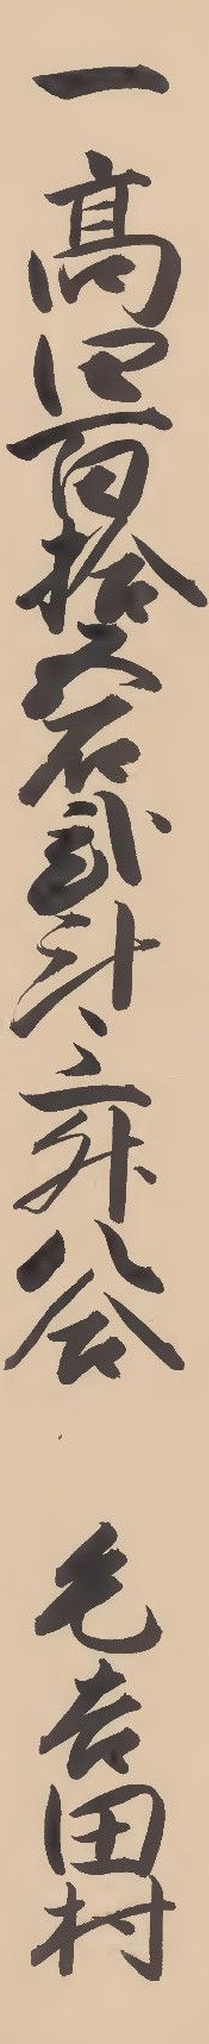一高四百拾五石弐斗三升八合毛吉田村
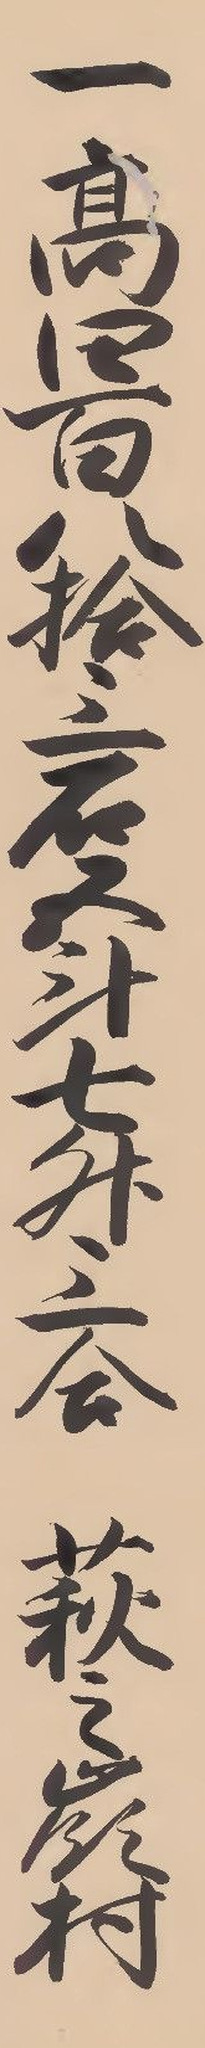一高四百八拾三石五斗七升三合萩之嶺村
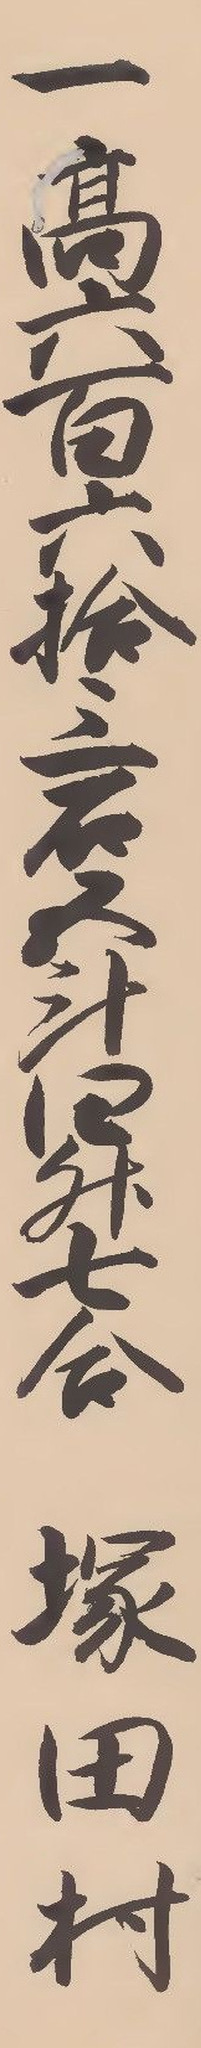一高六百六拾三石五斗四升七合塚田村
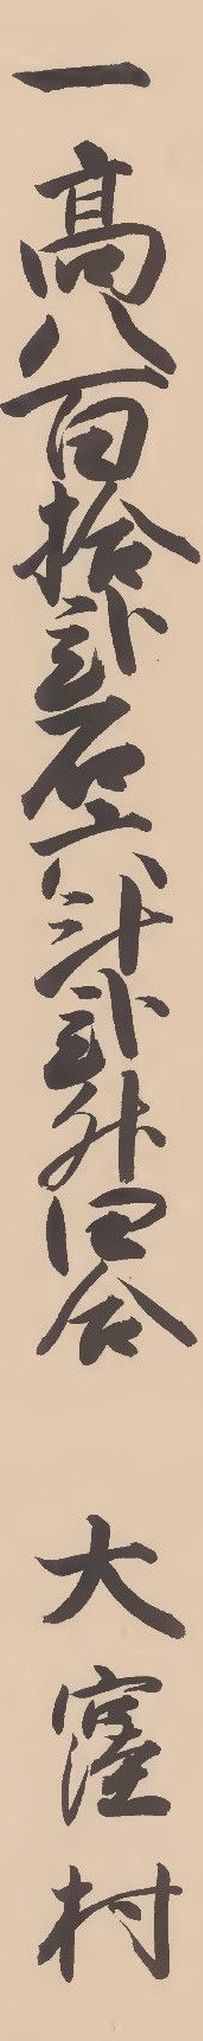一高八百拾弐石六斗弐升四合大窪村
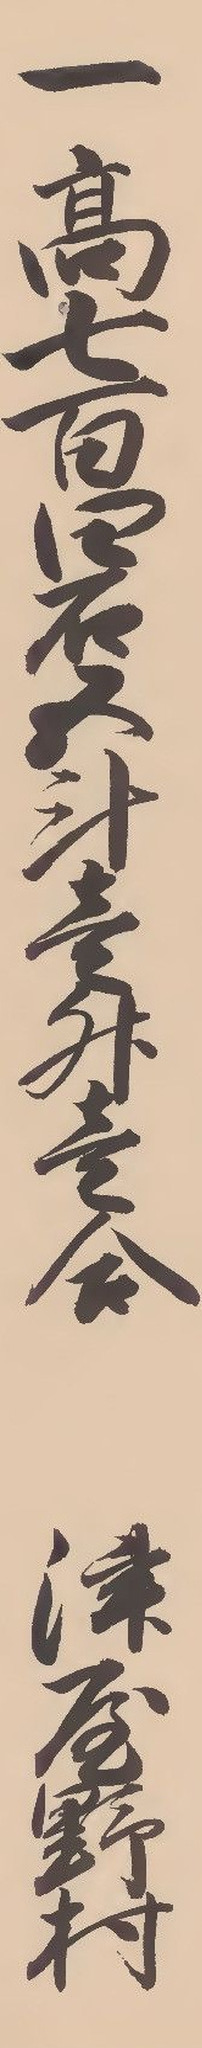一高七百四石五斗壱升壱合津屋野村
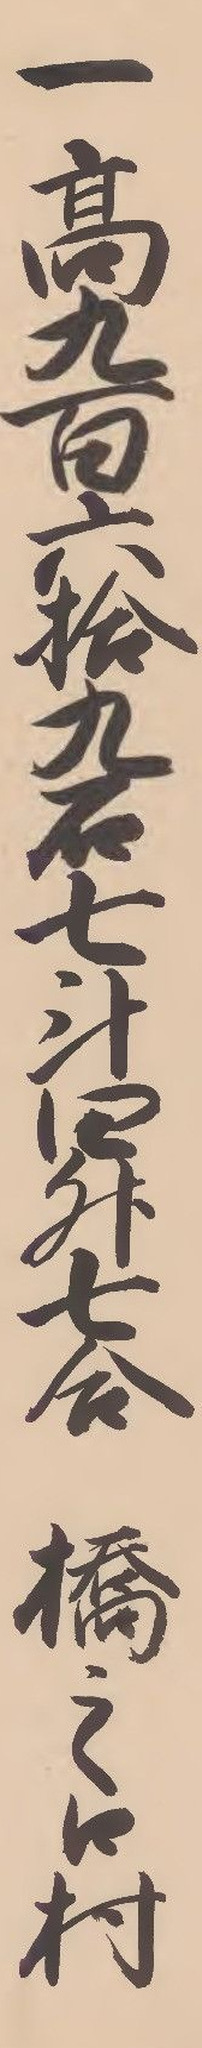一高九百六拾九石七斗四升七合橋之口村

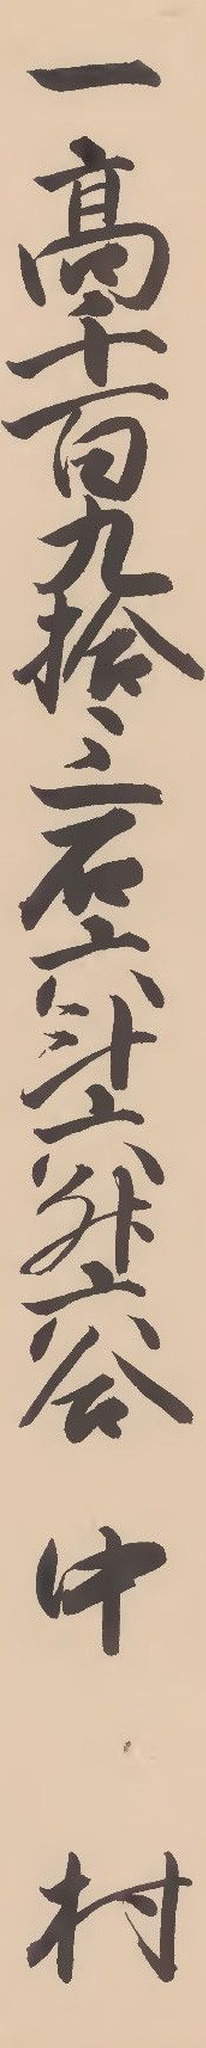一高千百九拾三石六斗六升六合中村
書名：日向国郷帳
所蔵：国立公文書館 National Archives of Japan
